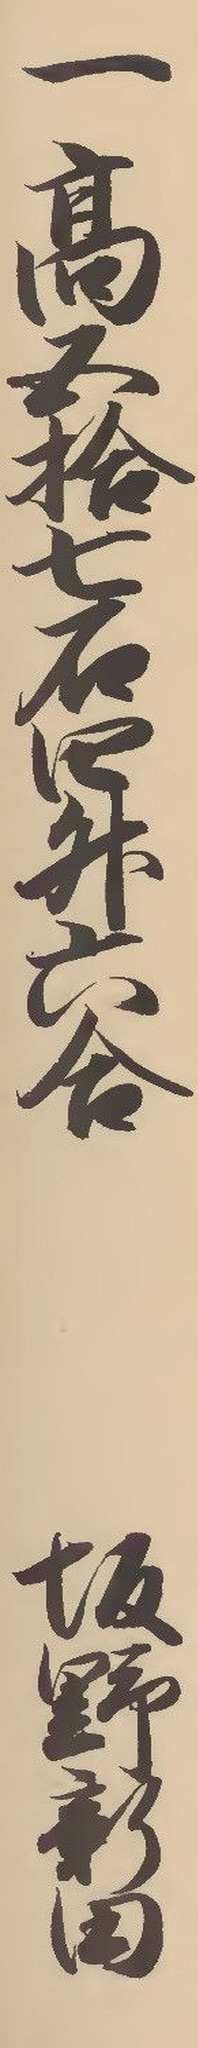一高五拾七石四升六合坂野新田
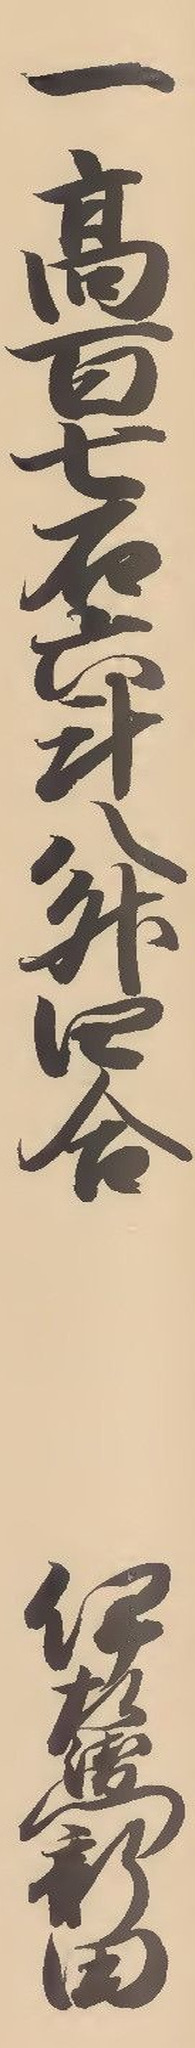一高百七石六斗八升四合伊左衛門新田
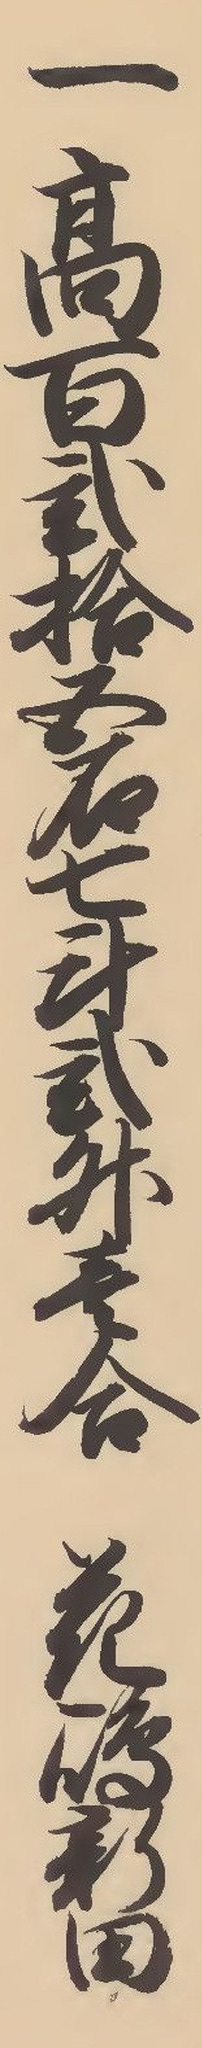一高百弐拾五石七斗弐升壱合花島新田
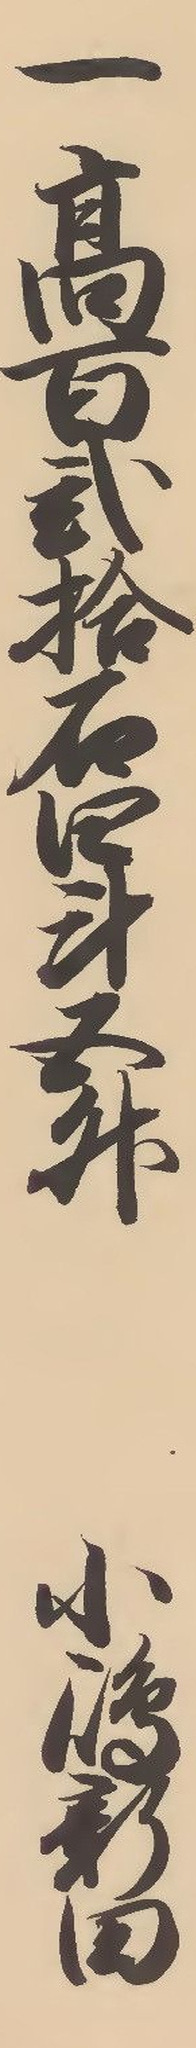一高百弐拾石四斗五升小島新田
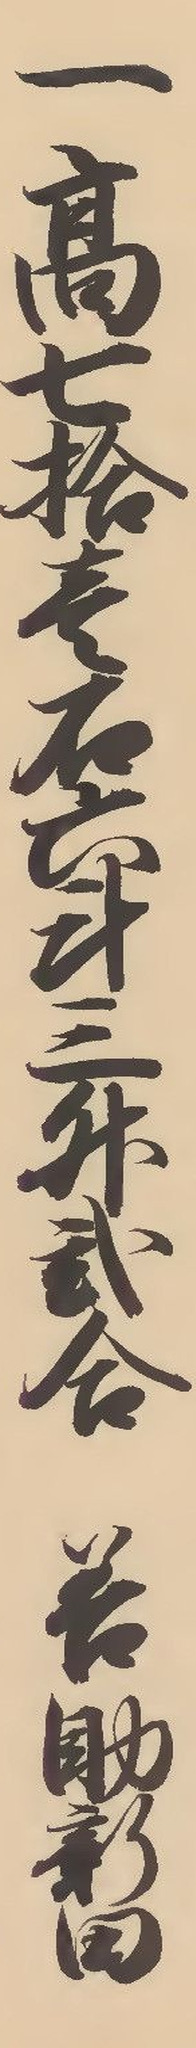一高七拾壱石六斗三升弐合善助新田

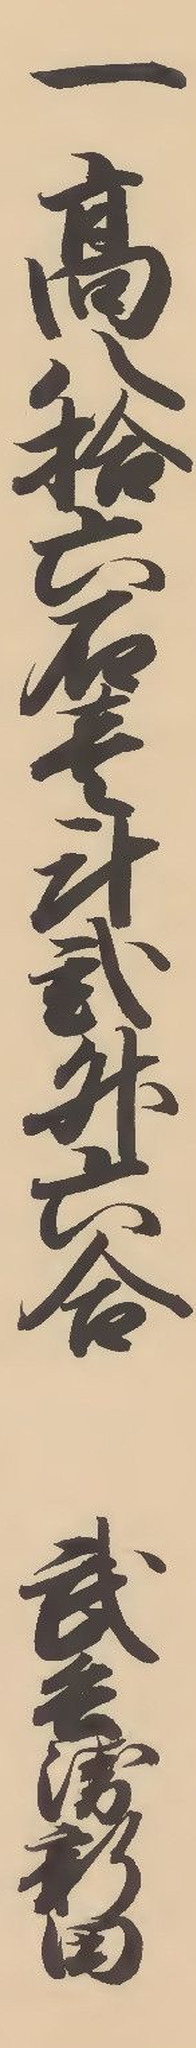一高八拾六石壱斗弐升六合武兵衛新田
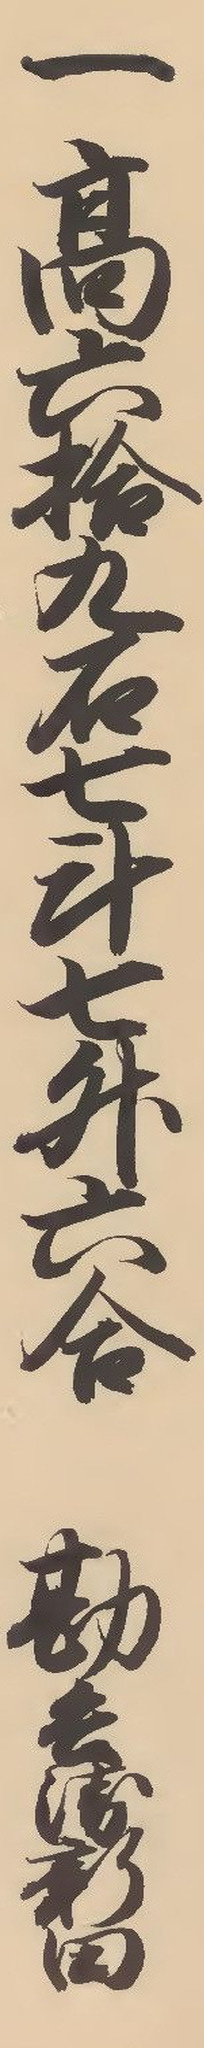一高六拾九石七斗七升六合勘兵衛新田
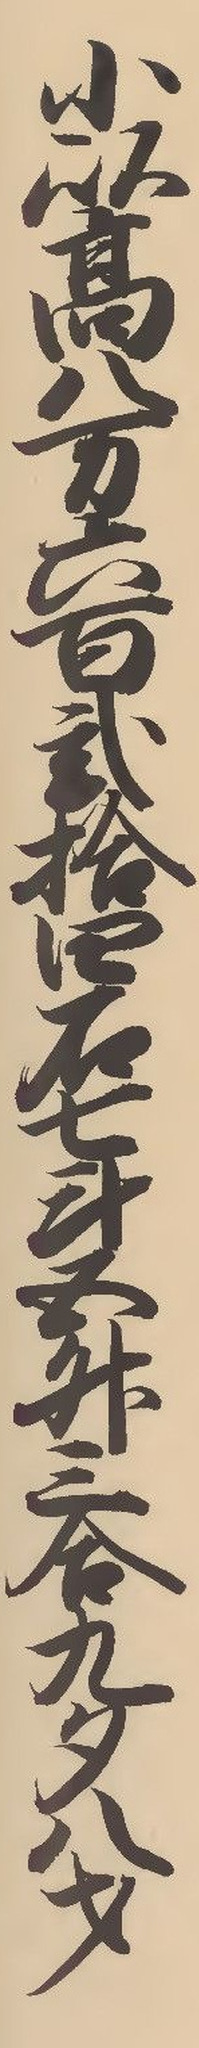小以高八万六百弐拾四石七斗五升三合九勺八才

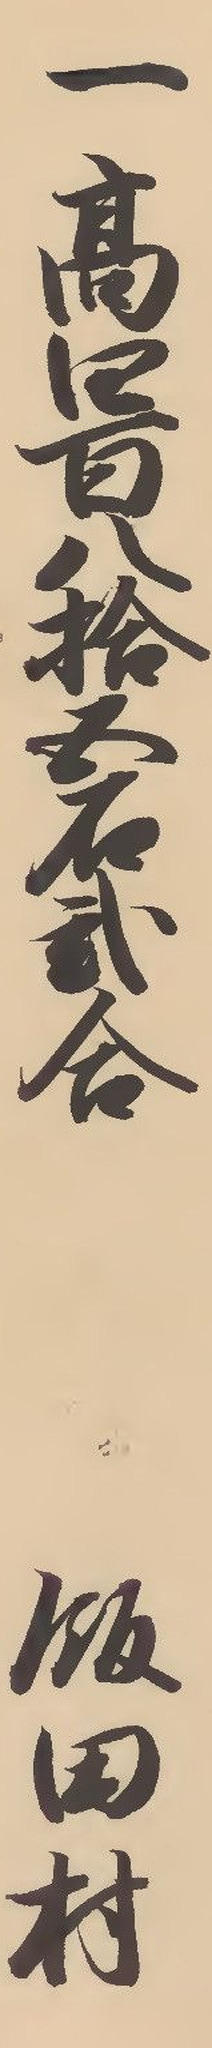一高四百八拾五石弐合飯田村
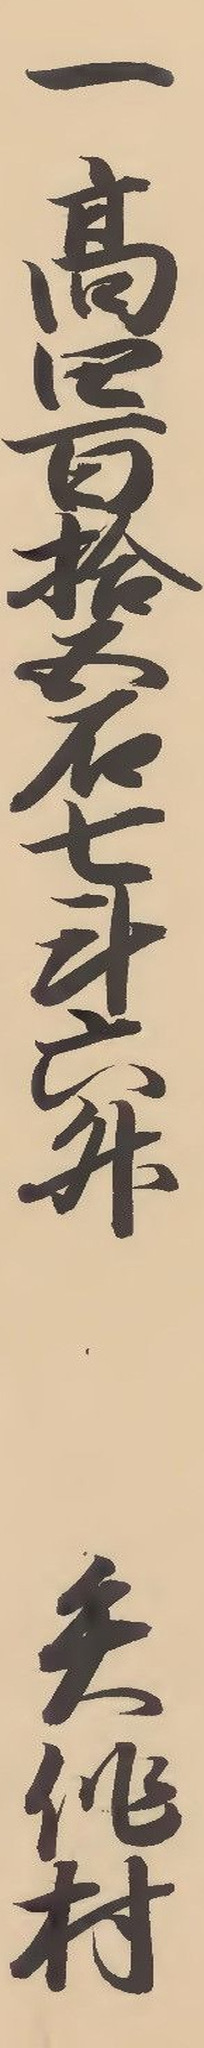一高四百拾五石七斗六升矢作村
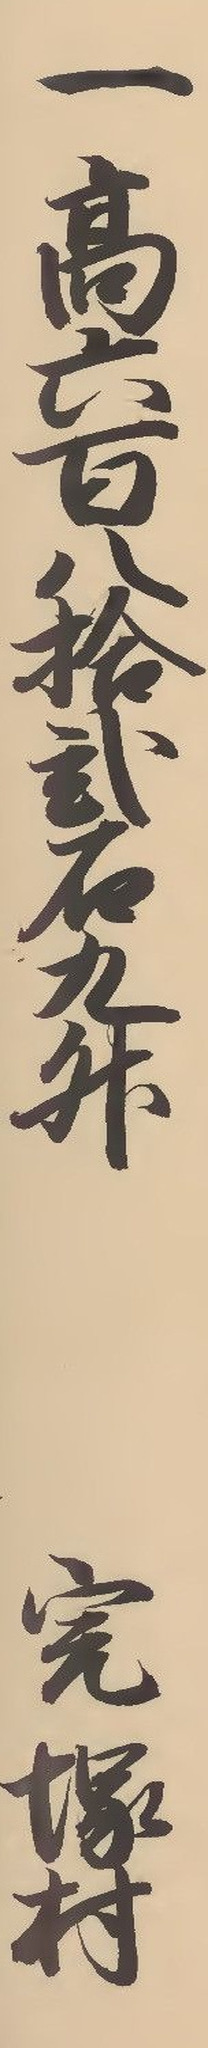一高六百八拾弐石九升宍塚村
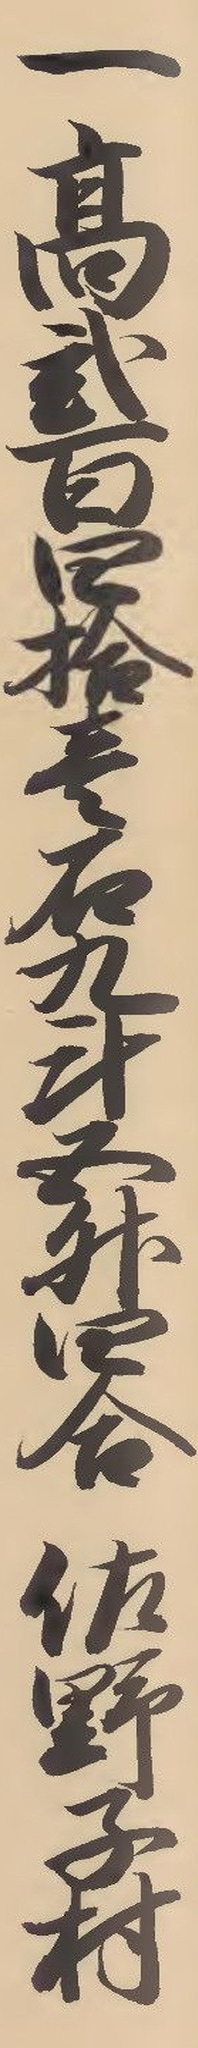一高弐百四拾壱石九斗五升四合佐野子村
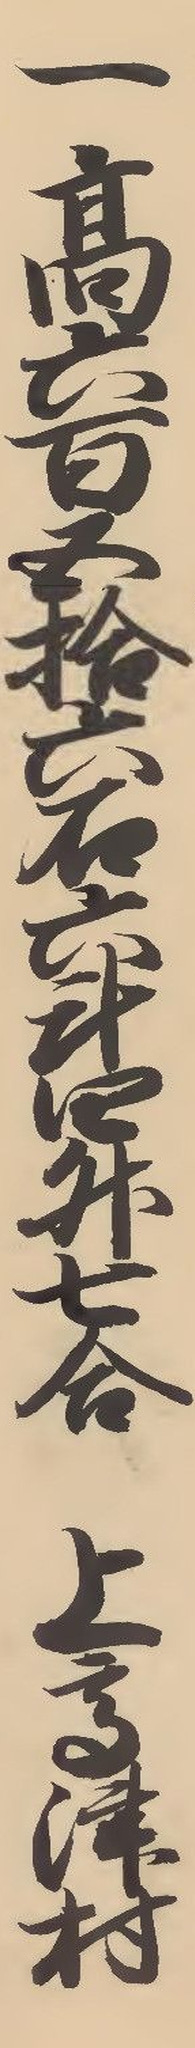一高六百五拾六石六斗四升七合上高津村
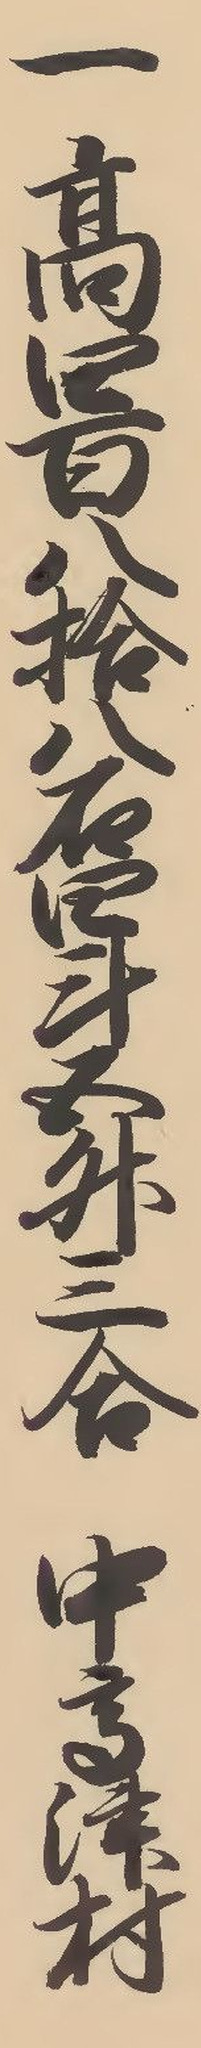一高四百八拾八石四斗五升三合中高津村

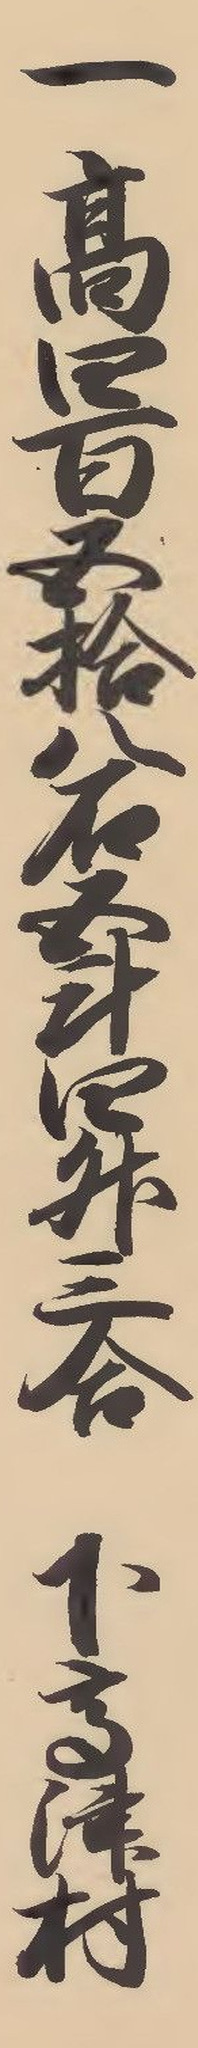一高四百五拾八石五斗四升三合下高津村
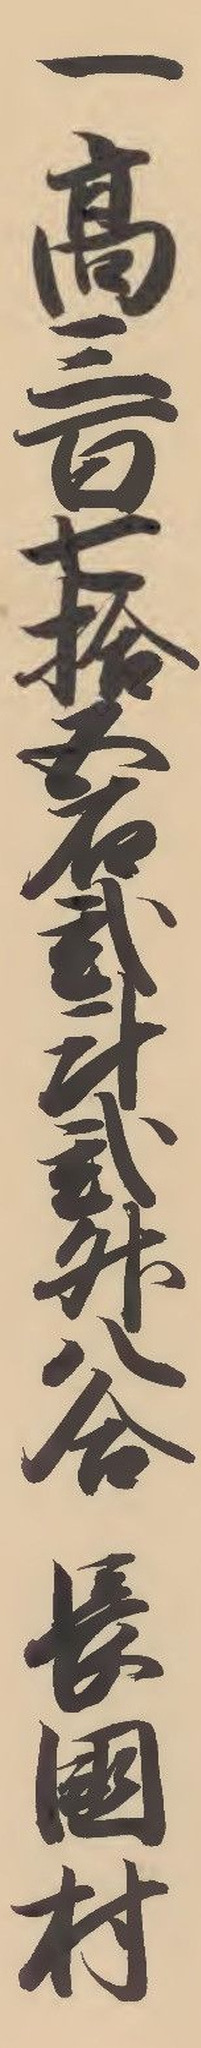一高三百七拾五名弐斗弐升八合長国村
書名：常陸国郷帳
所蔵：国立公文書館 National Archives of Japan
